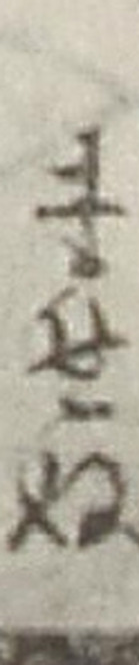ませぬ
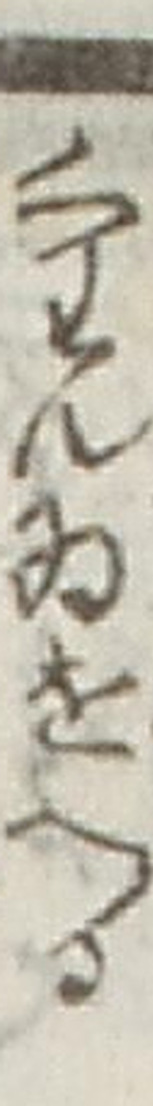くわんゐをへる
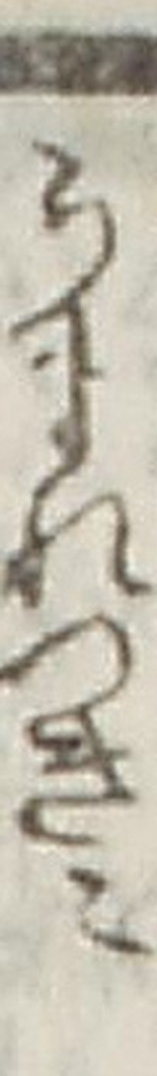うまれつきに
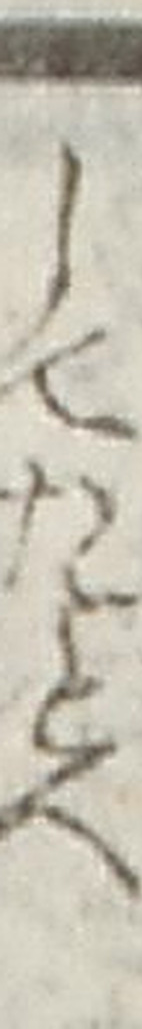してたとへ
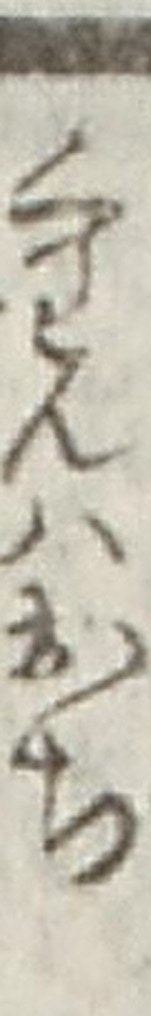くわんはおち
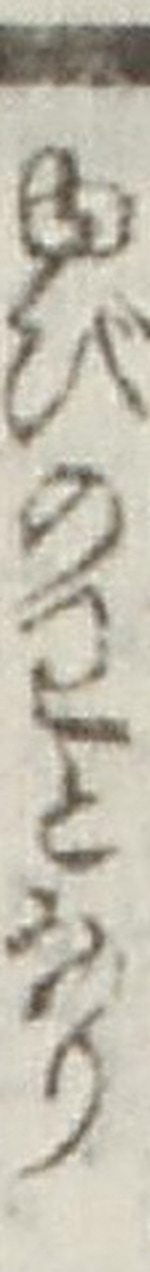ゆびのわとなり
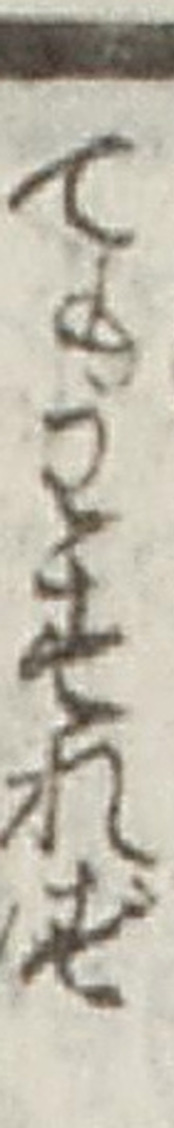てもわすれず
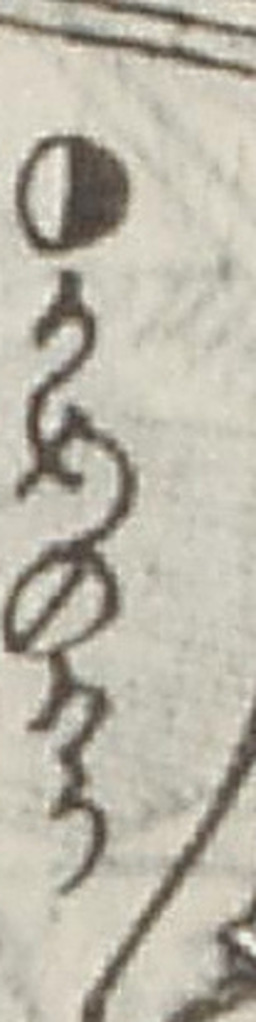◑かめのかう
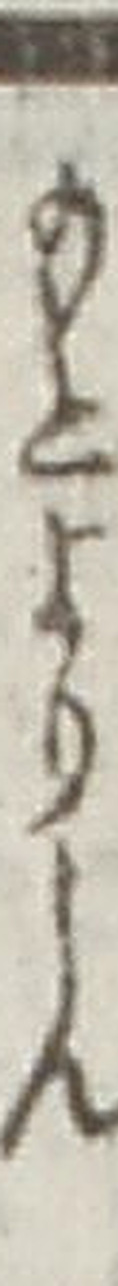もとよりしん
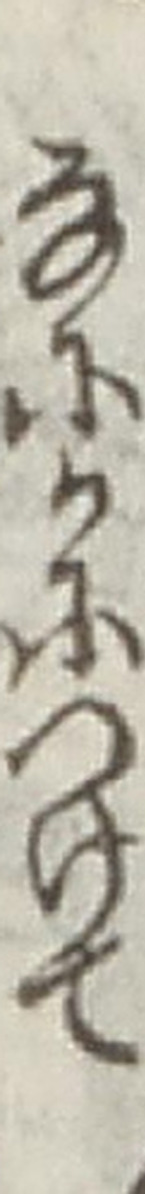なにかにつけて
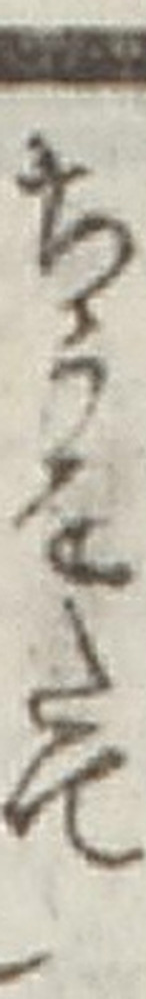ちうをたて
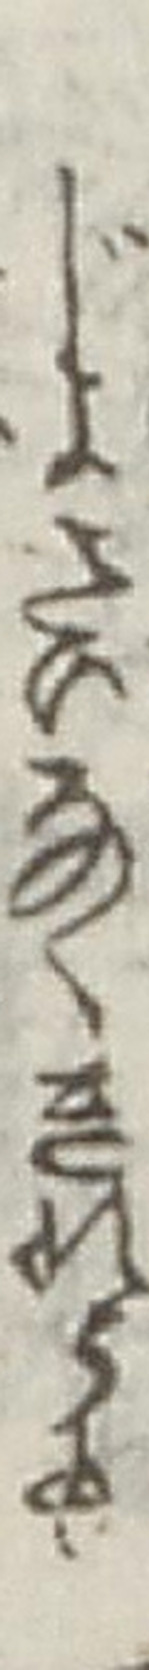じよさいなくきれうも
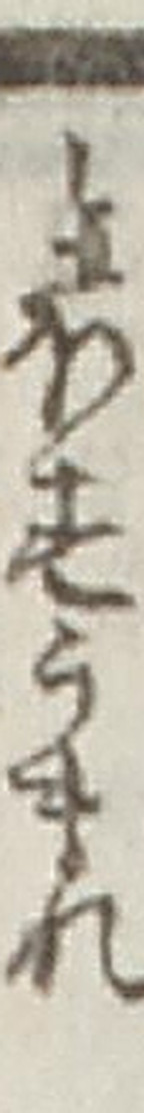もほすうまれ
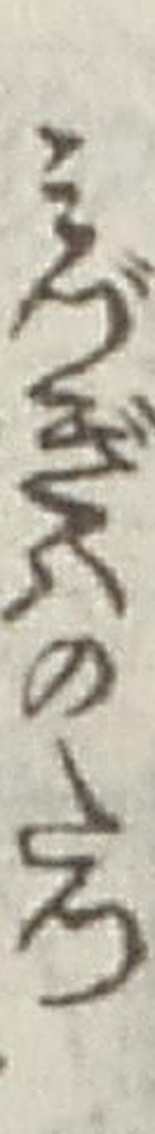みづきはのたつ
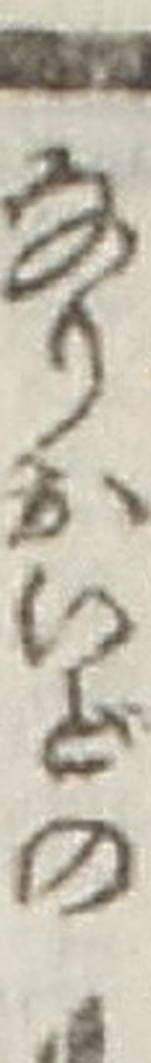なりおいどの
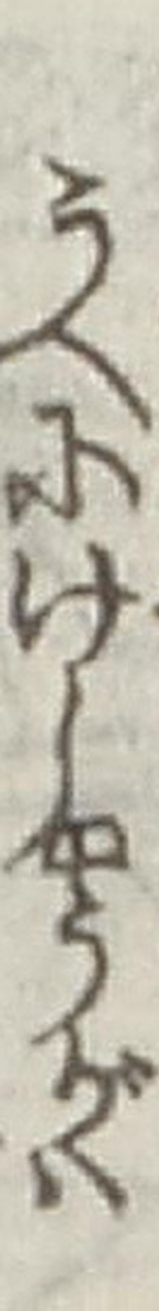うへにけしやうげは
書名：三世相出雲當座帳　上下冊
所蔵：東京大学地震研究所図書室 Earthquake Research Institute Library, The University of Tokyo, JAPAN
